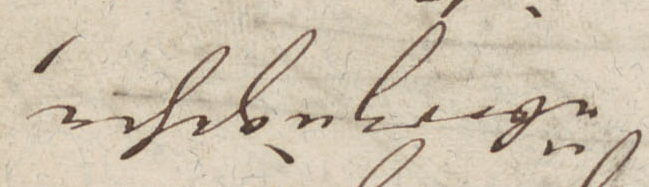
rechtfertigen
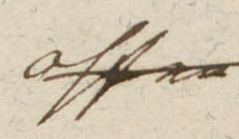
befinden,
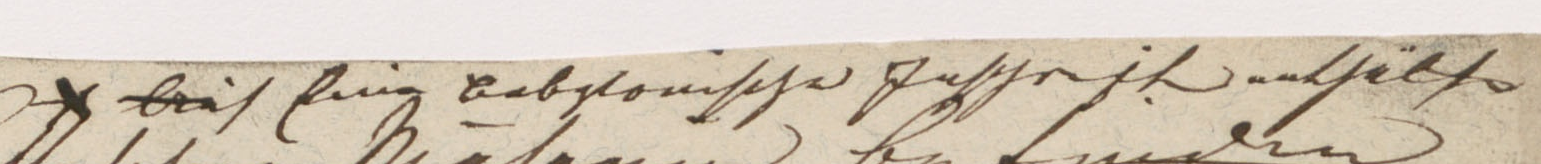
% Auf Eine Babylonische Inschrift enthält
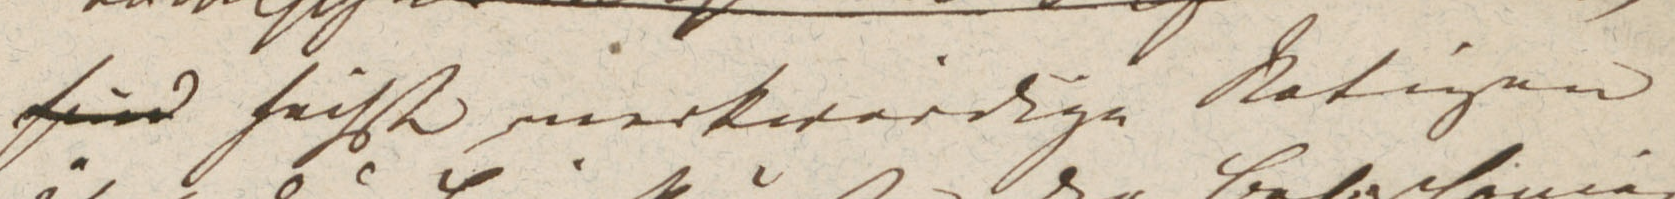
sind höchst merkwürdige Notizen
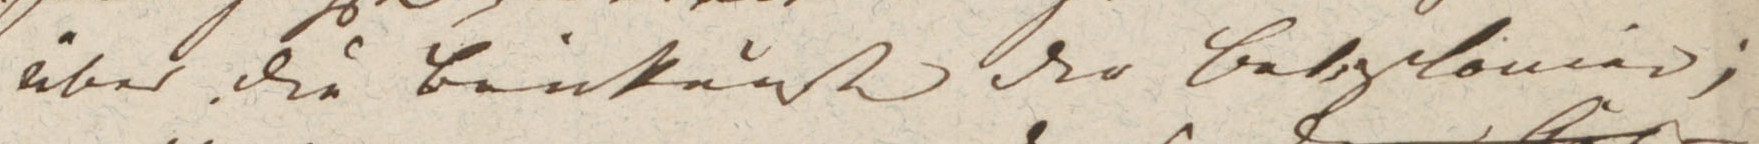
über die Baukunst der Babylonier;
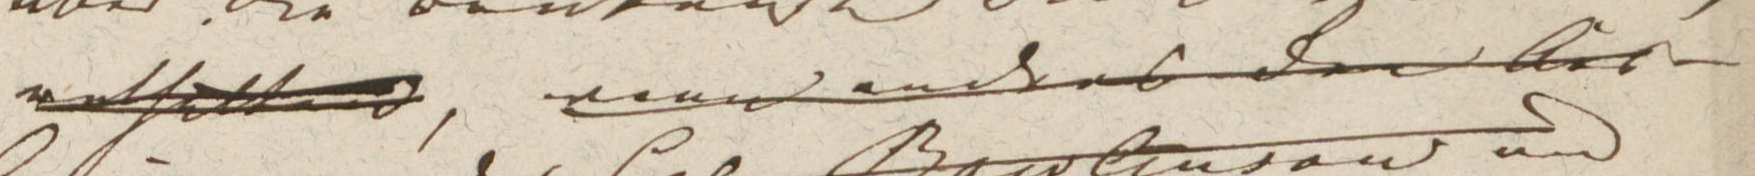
enthalten, wenn anders den Aus-
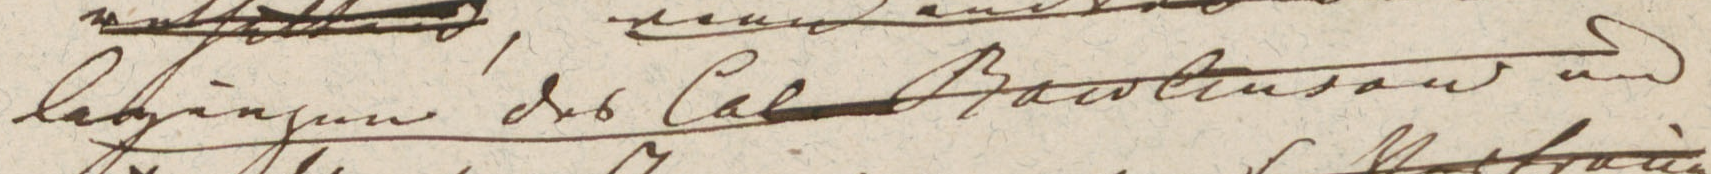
legungen des Col Rawlinson und
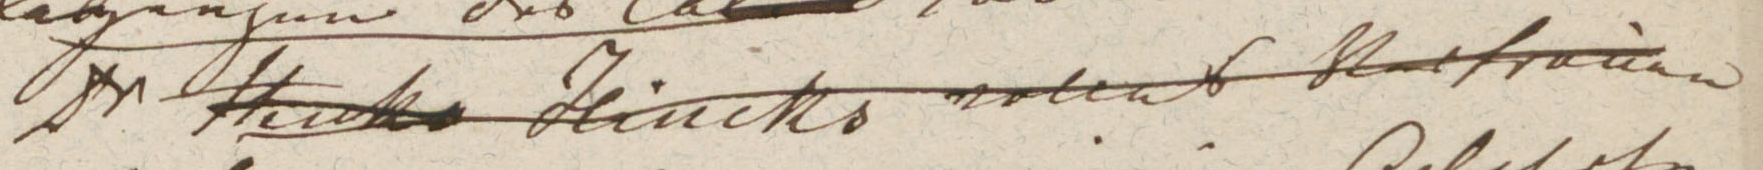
Dr Hinks Hinks volles Vertrauen
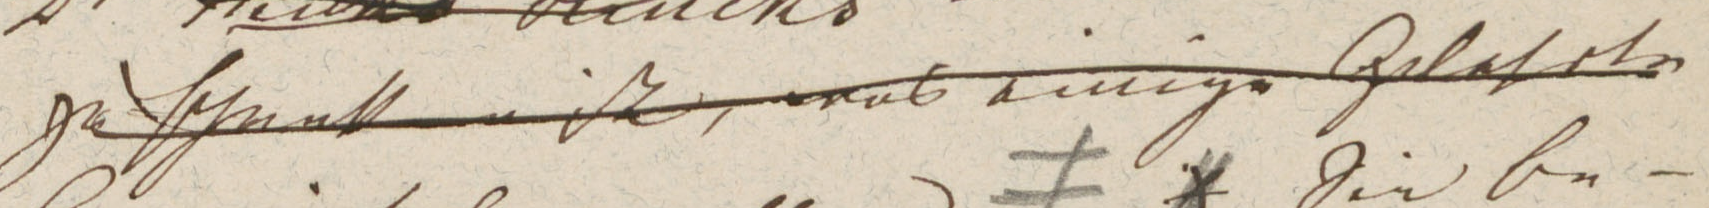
zu schenken ist, was einige Gelehrte
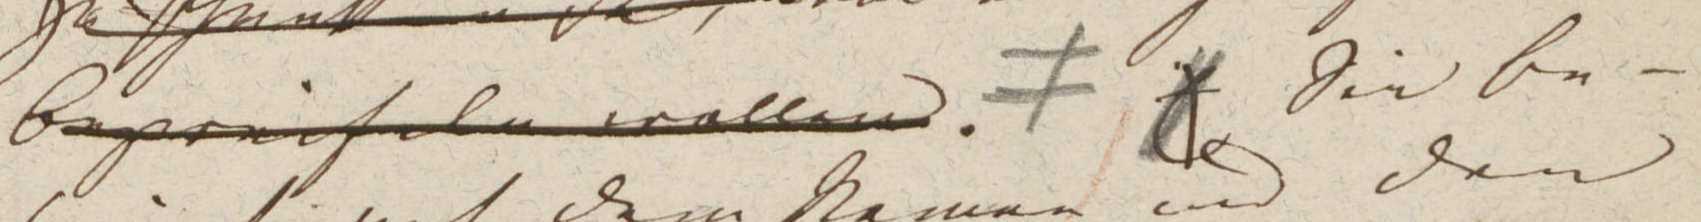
bezweifeln wollen. % E Sie be-
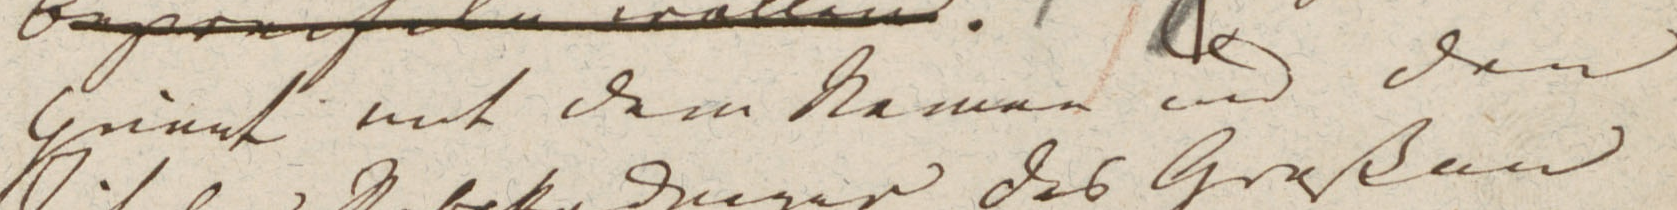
ginnt mit dem Namen und den
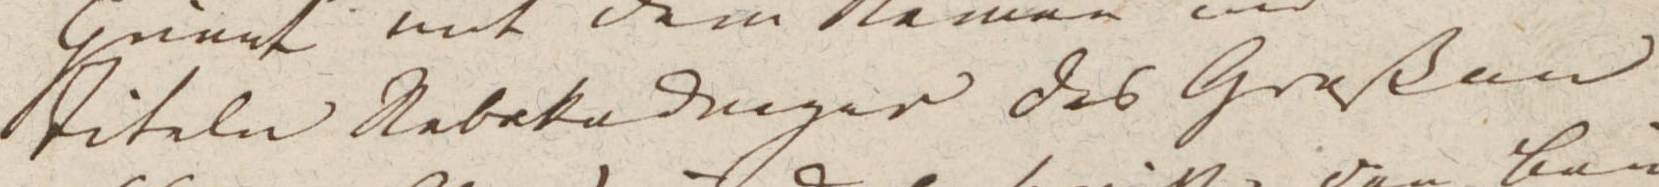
Titeln Nebukadnezar des Grossen
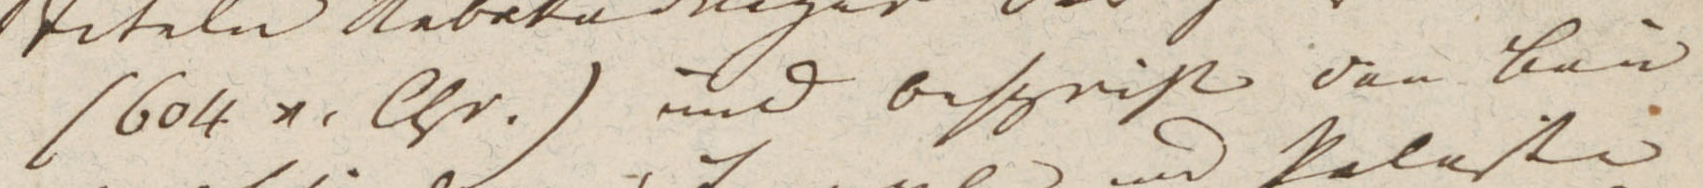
(604 v. Chr.) und bespricht den Bau
